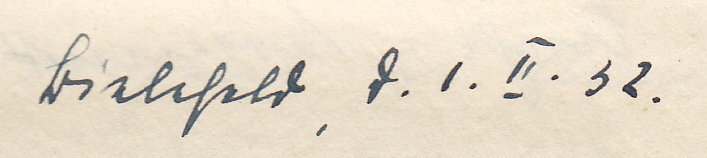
Bielefeld, d 1. II. 32
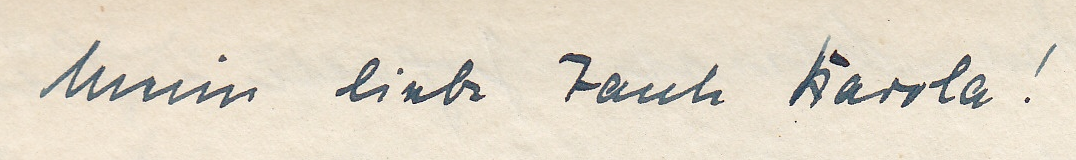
Meine liebe Tante Karola!
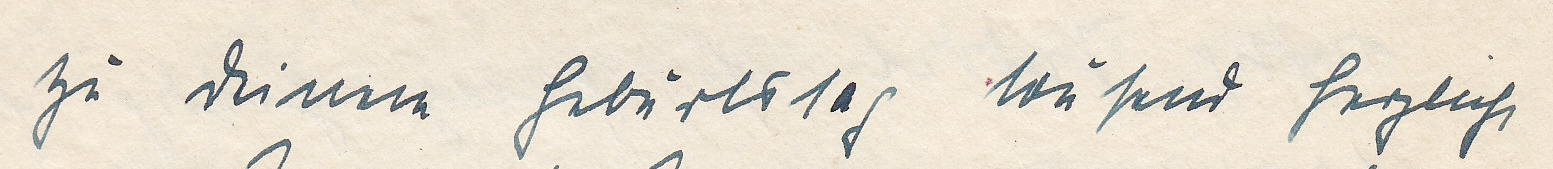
zu deinem Geburtstag tausend herzliche
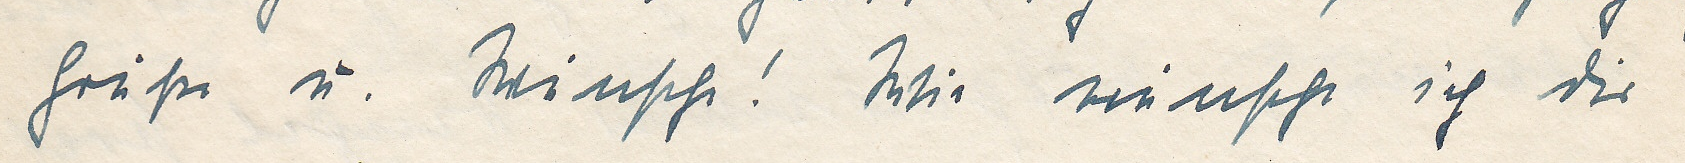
Grüße u. Wünsche! Wie wünsche ich Dir
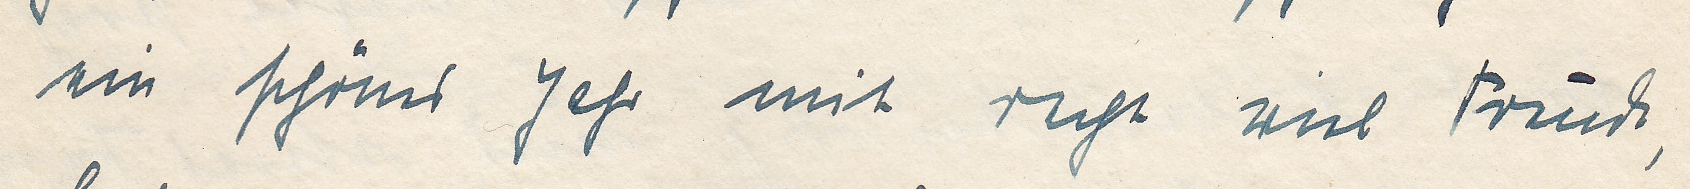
ein schönes Jahr mit recht viel Freude,
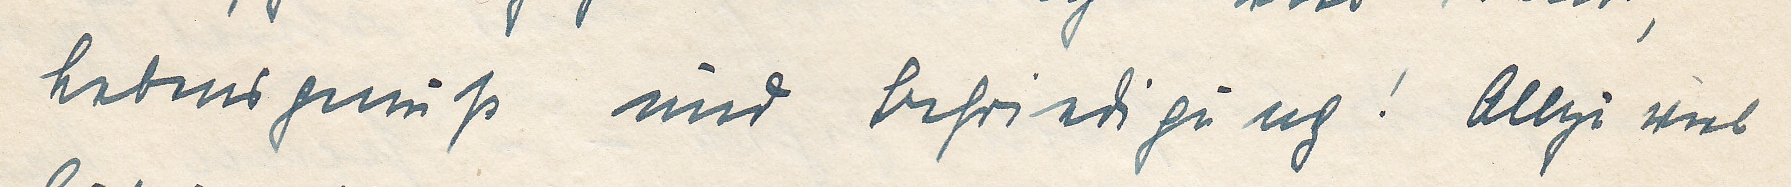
Lebensgenuß und Befriedigung! Allzu viel
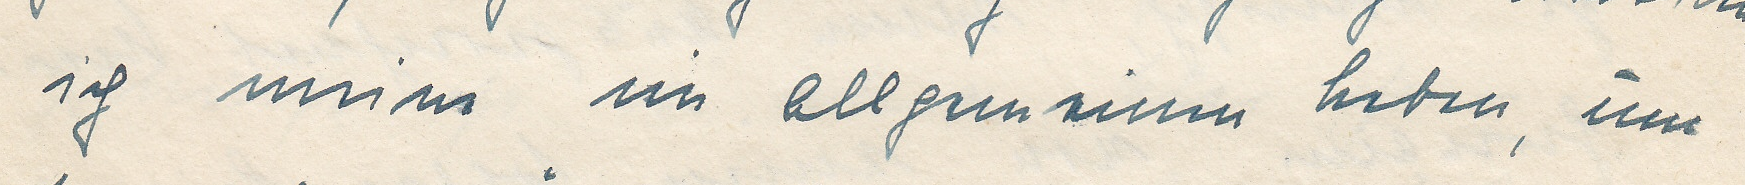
ich meine im allgemeinen Leben, um
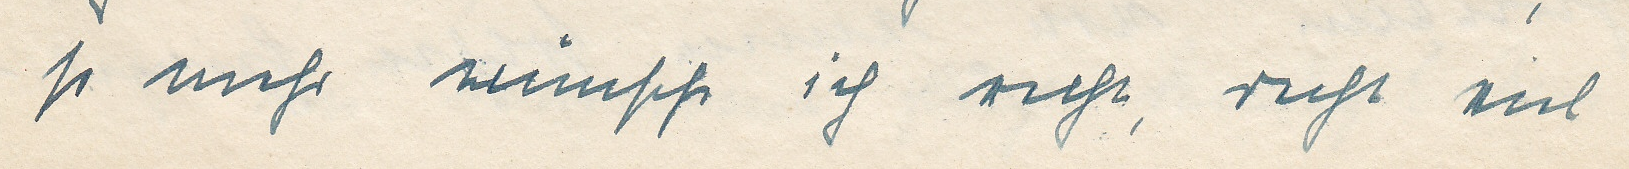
so mehr wünsche ich recht, recht viel
